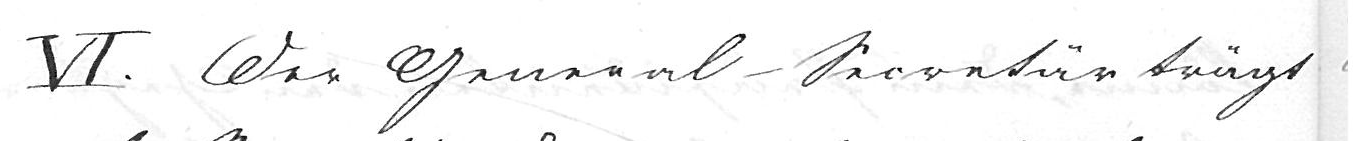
VI. Der General-Secretär trägt
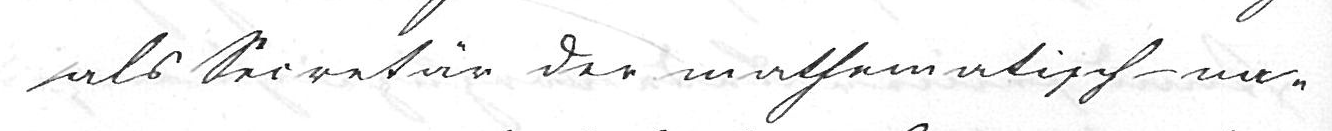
als Secretär der mathematischen-na-
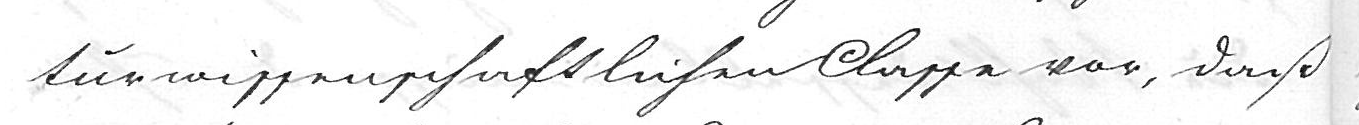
turwissenschaftlichen Classe vor, daß
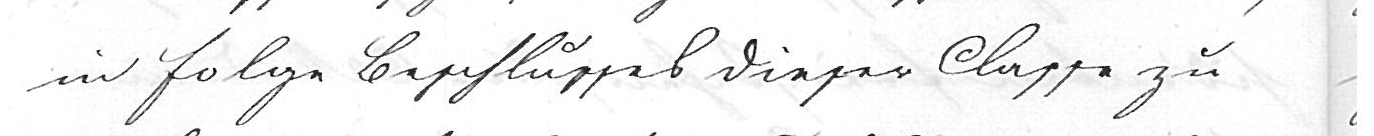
in Folge Beschlusses dieser Classe zu
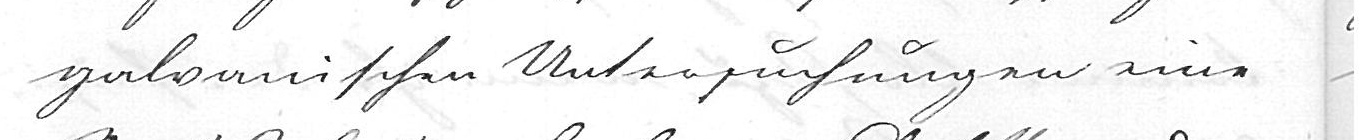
galvaischen Untersuchungen eine
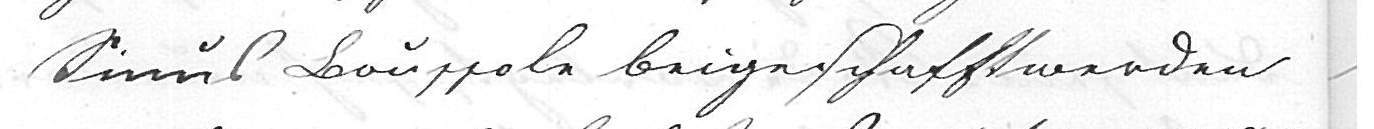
Sinus Boussole beigeschafft werden
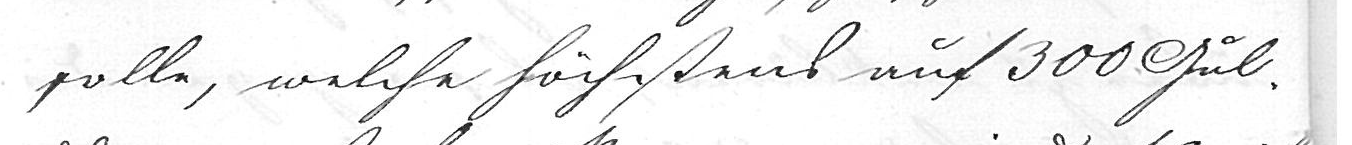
solle, welche höchstens auf 300 Gul-
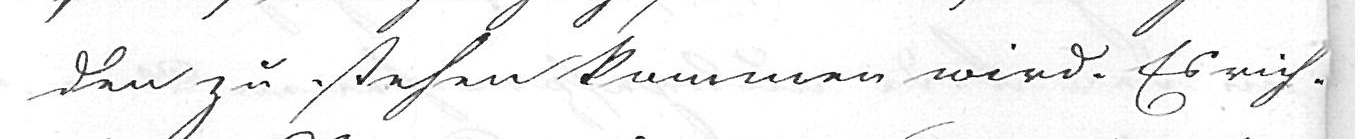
den zu stehen kommen wird. Es rich-
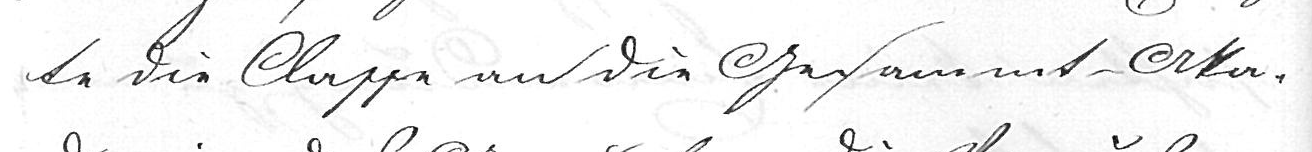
te die Classe an die Gesammt-Aka-
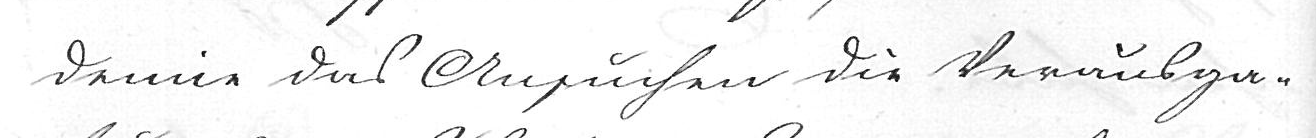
demie das Ansuchen die Verausga-
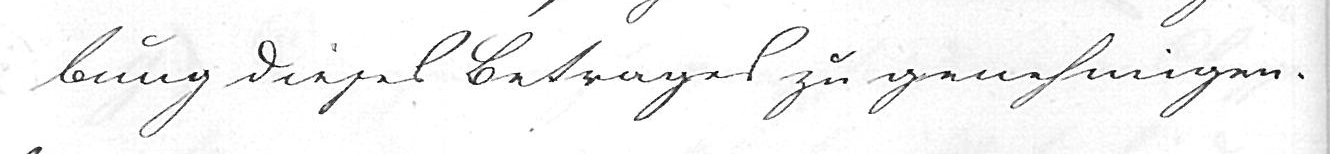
bung dieses Betrages zu genehmigen.
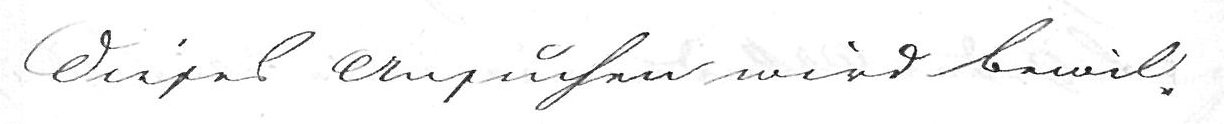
Dieses Ansuchen wird bewil-
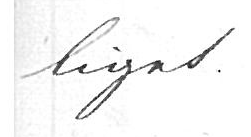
liget.
